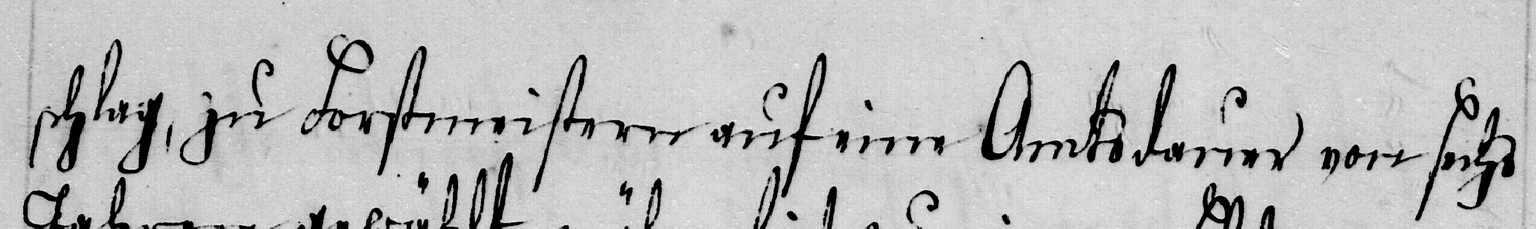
schlag, zu Forstmeistern auf eine Amtsdauer von sechs
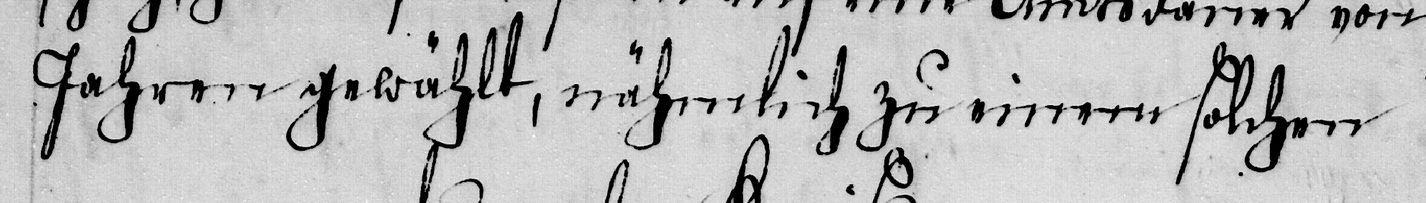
Jahren gewählt, nähmlich zu einem solchen
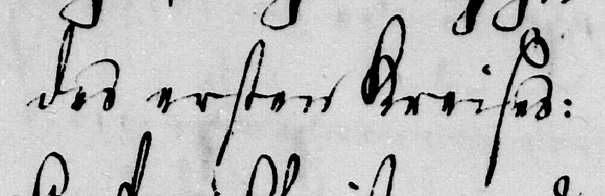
des ersten Kreises:
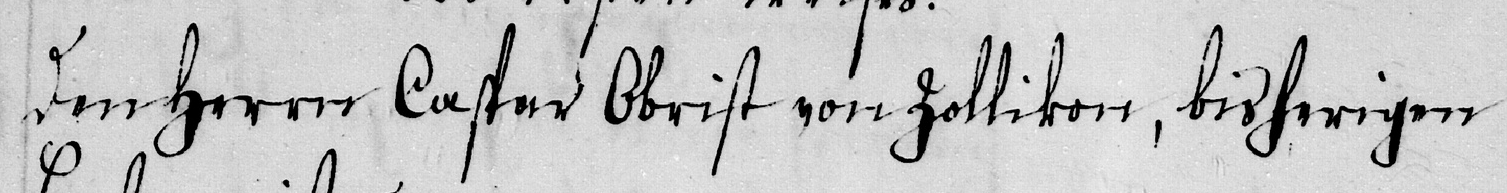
Den Herrn Caspar Obrist von Zollikon, bisherigen
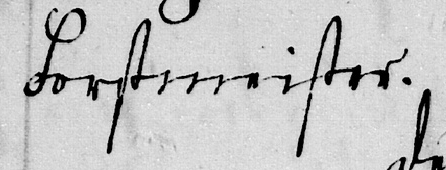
Forstmeister.
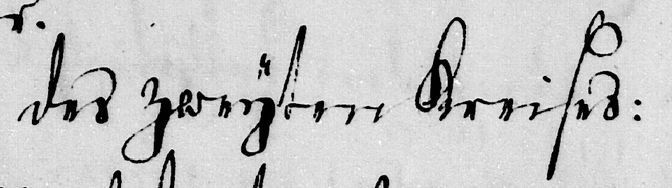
des zweyten Kreises:
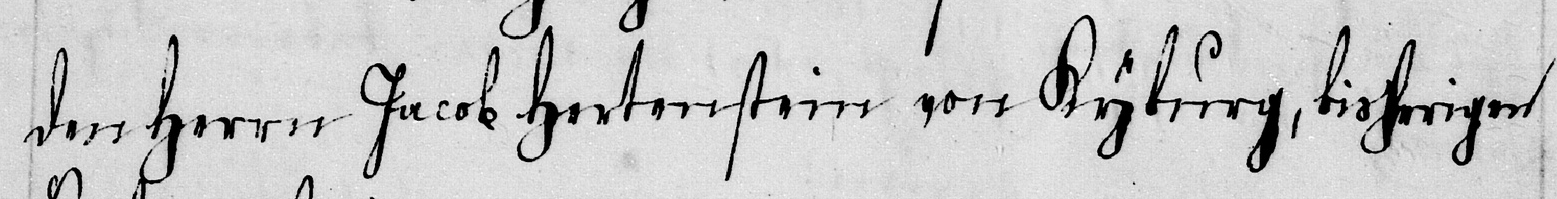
den Herrn Jacob Hertenstein von Kyburg, bisherigen
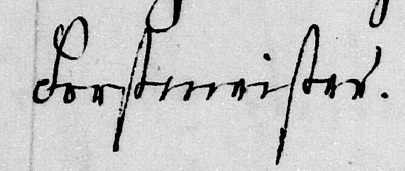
Forstmeister.
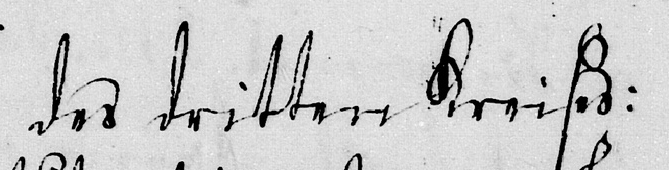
des dritten Kreises:
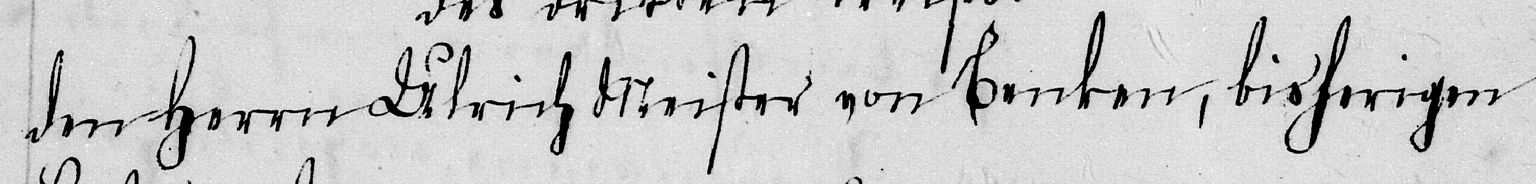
den Herrn Ulrich Meister von Benken, bisherigen
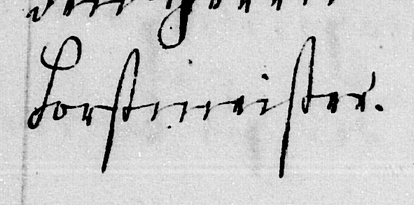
Forstmeister.
